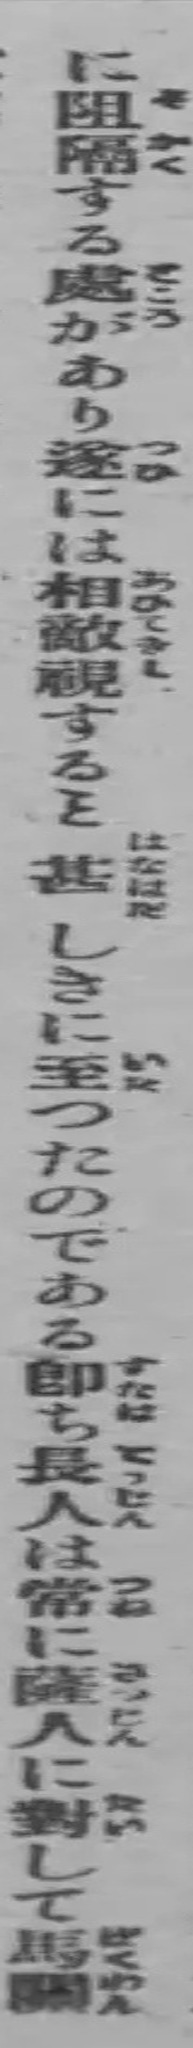に阻隔する処があり遂には相敵視すること甚しきに至つたのである即ち長人は常に薩人に対して馬関
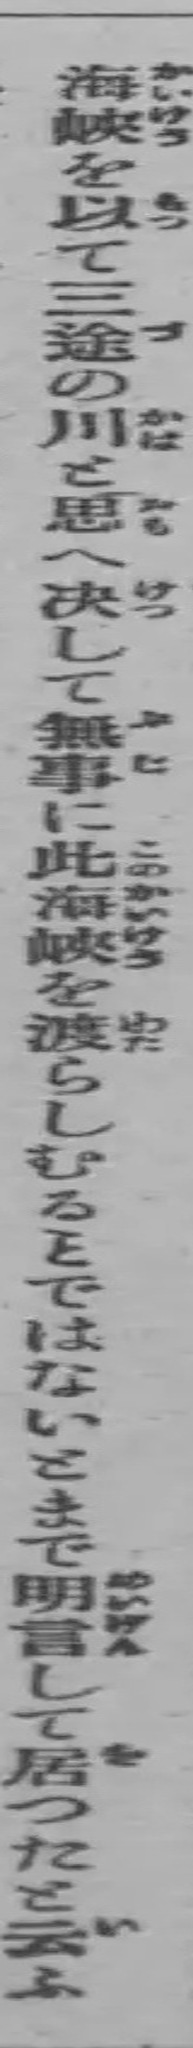海峡を以て三途の川と思へ決して無事に此海峡を渡らしむることではないとまで明言して居つたと云ふ
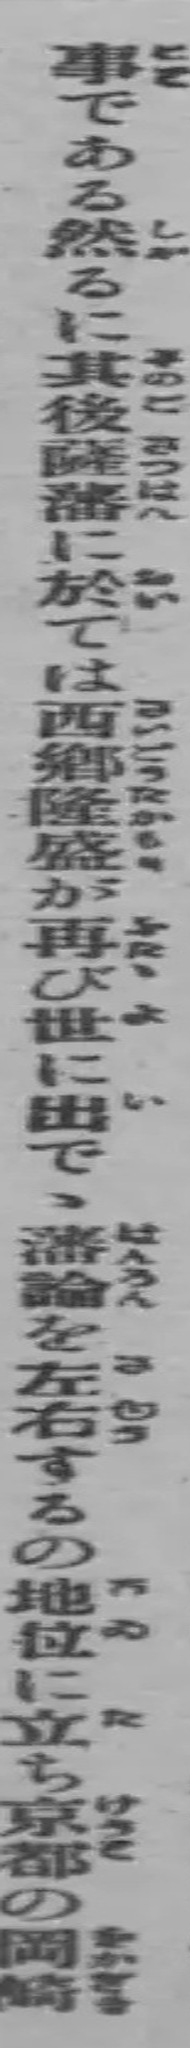事である然るに其後薩藩に於ては西郷隆盛が再び世に出でゝ藩論を左右するの地位に立ち京都の岡崎
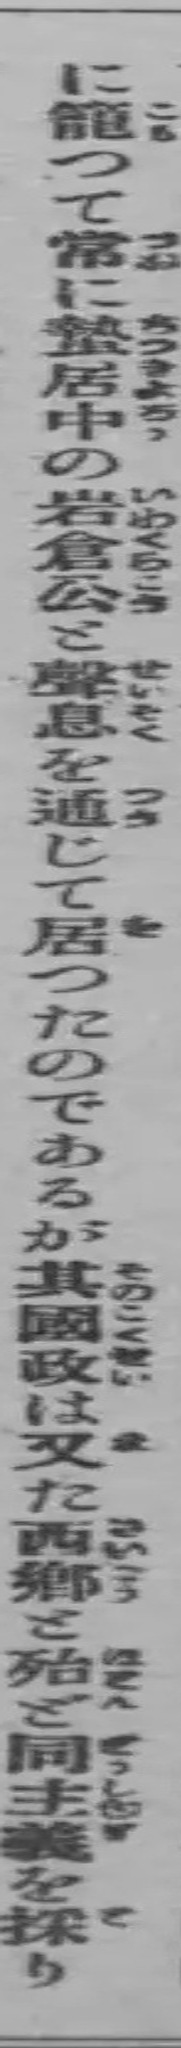に籠つて常に蟄居中の岩倉公と声息を通じて居つたのであるが其国政は又た西郷と殆ど同主義を採り
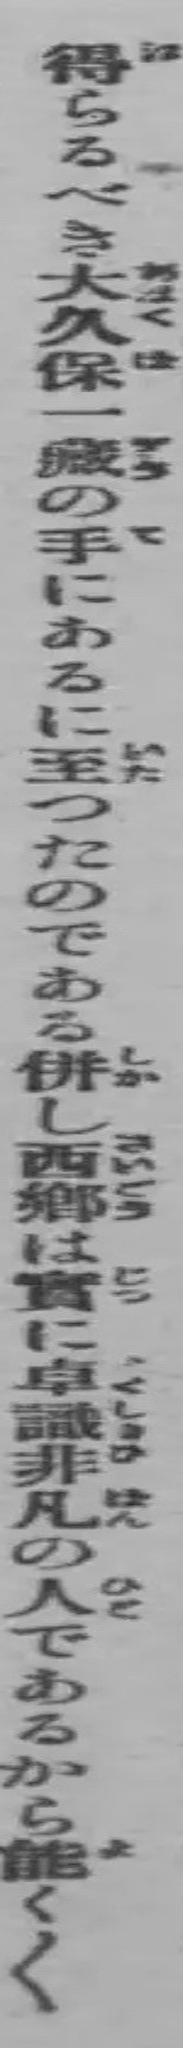得らるべき大久保一蔵の手にあるに至つたのである併し西郷は実に卓識非凡の人であるから能く〳〵
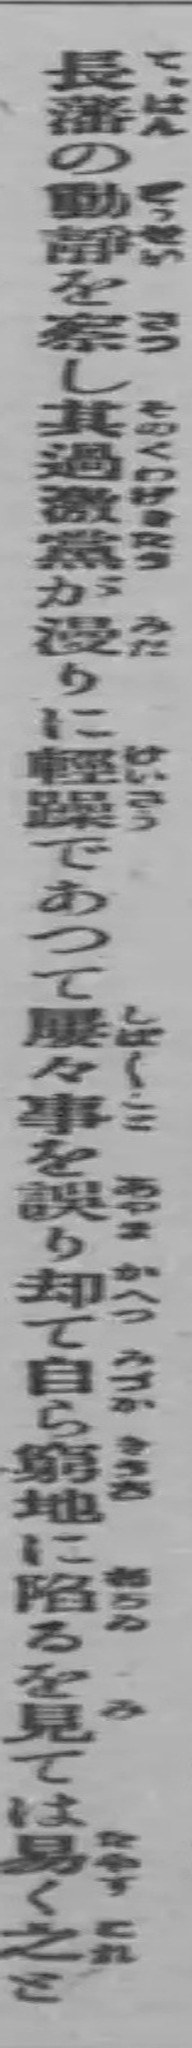長藩の動静を察し其過激党が漫りに軽躁であつて屡々事を誤り却て自ら窮地に陥るを見ては易く之と
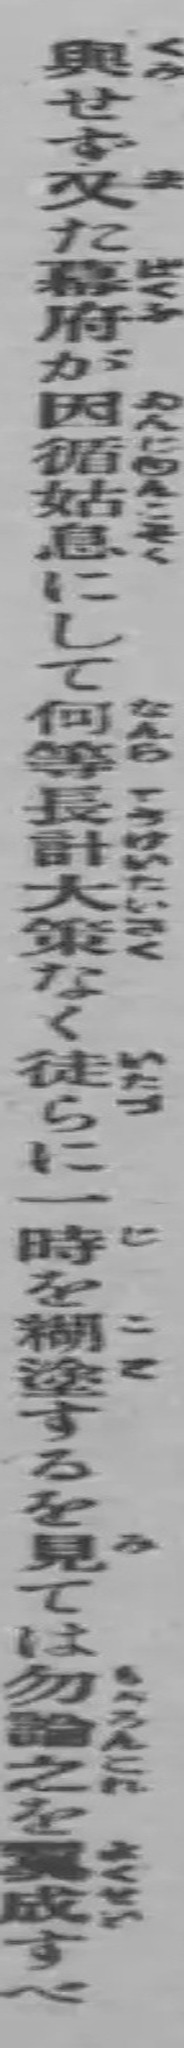与せず又た幕府が因循姑息にして何等長計大策なく徒らに一時を糊塗するを見ては勿論之を翼成すべ
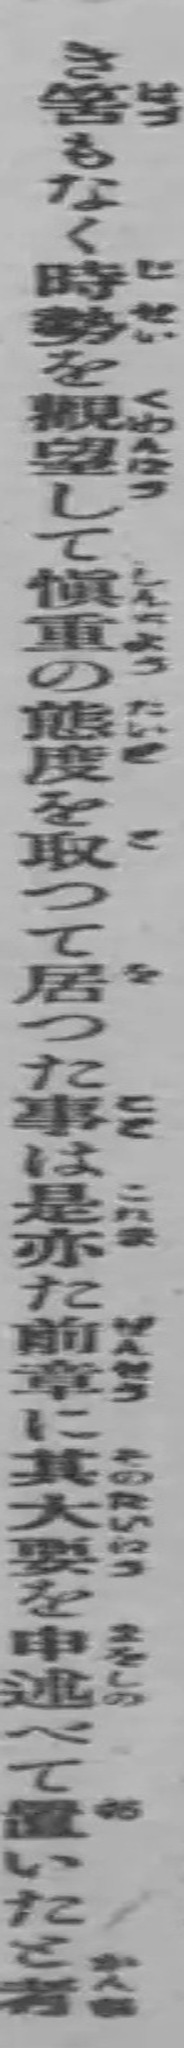き筈もなく時勢を観望して慎重の態度を取つて居つた事は是亦た前章に其大要を申述べて置いたと考
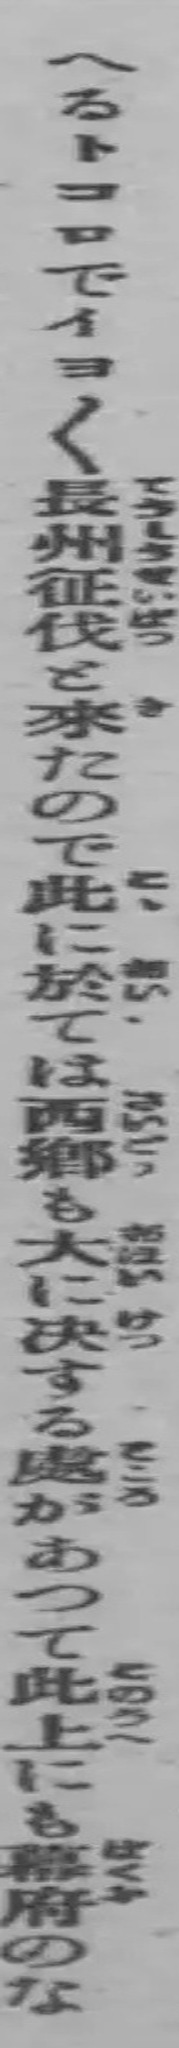へるトコロでイヨ〳〵長州征伐と来たので此に於ては西郷も大に決する処があつて此上にも幕府のな
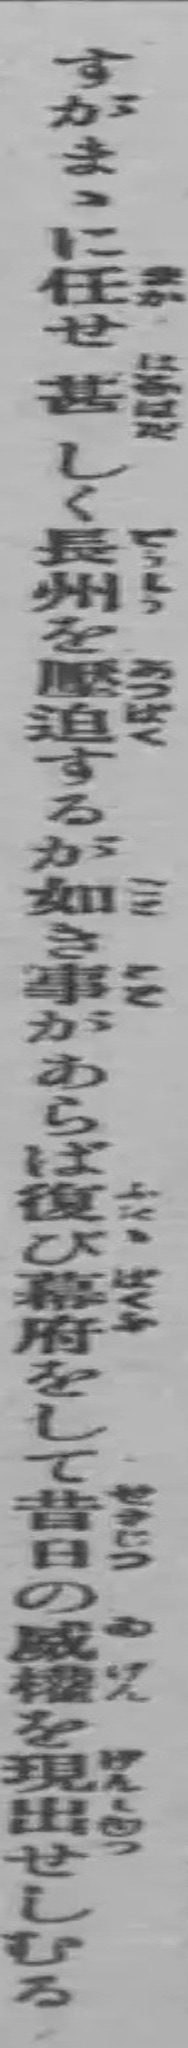すがまゝに任せ甚しく長州を圧迫するが如き事あらば復び幕府をして昔日の威権を現出せしむる
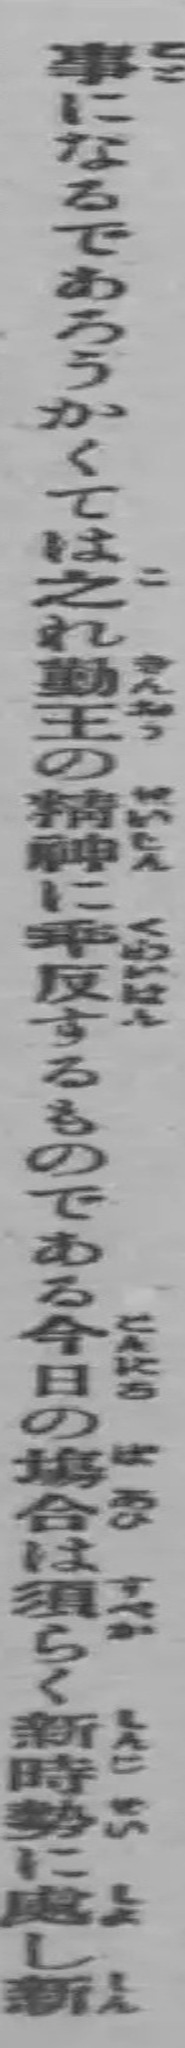事になるであろうかくては之れ勤王の精神に乖反するものである今日の場合は須らく新時勢に処し新
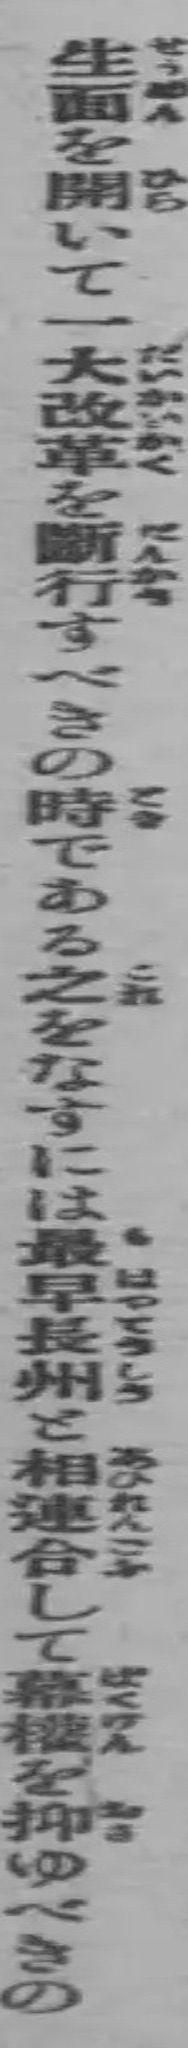生面を開いて一大改革を断行すべきの時である之をなすには最早長州と相連合して幕府を抑ゆべきの

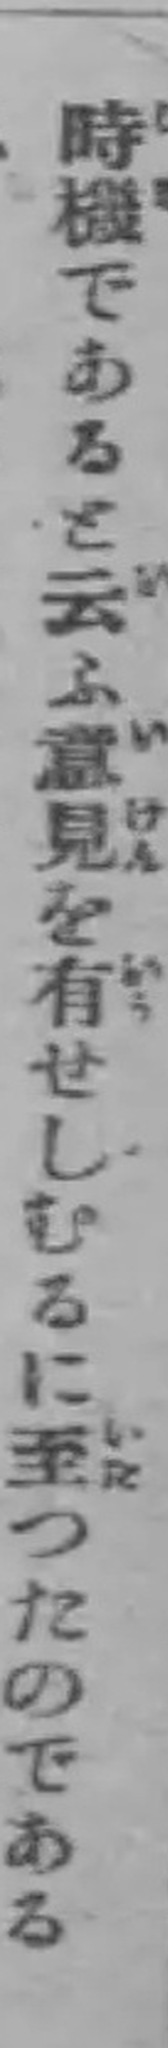時機であると云ふ意見を有せしむるに至つたのである
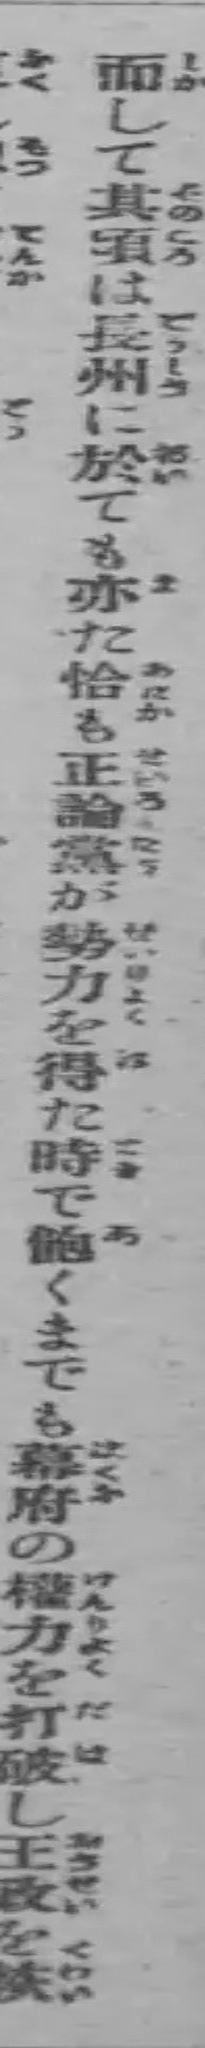而して其頃は長州に於ても亦た恰も正論党が勢力をえた時で飽くまでも幕府の権力を打破し王政を恢
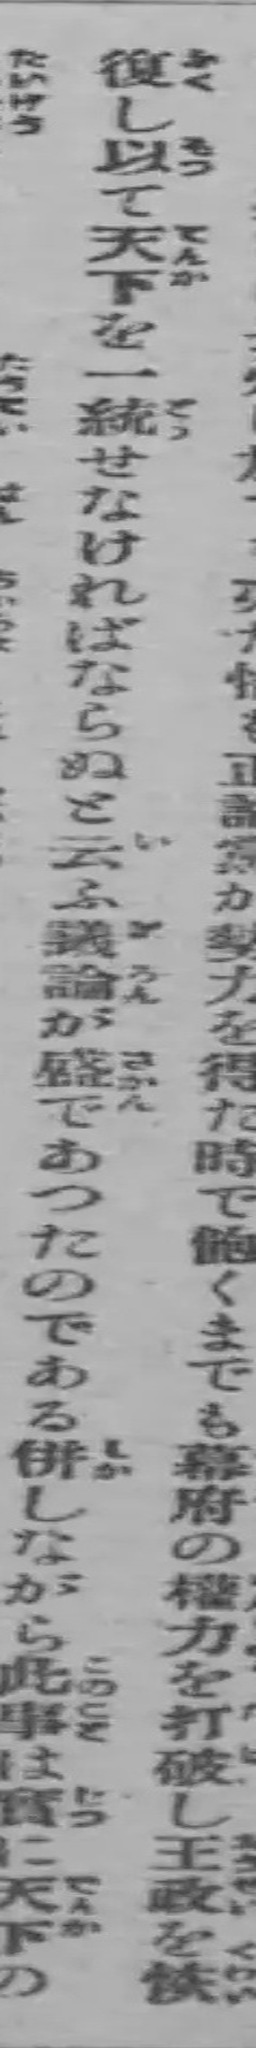復し以て天下を一統せなければならぬと云ふ議論が盛であうたのである併しながら此事は実に天下の
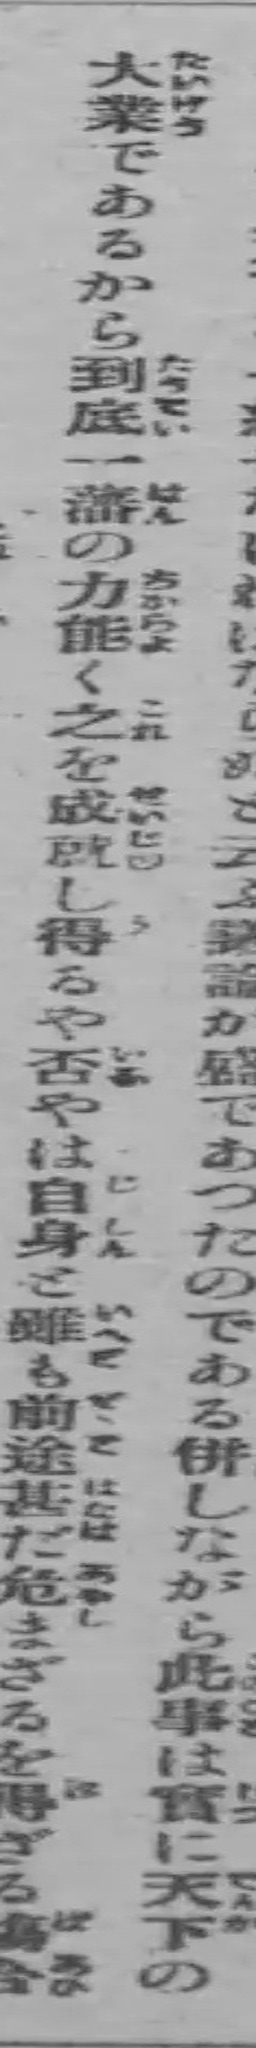大業であるから到底一藩の力能く之を成就し得るや否やは自身と雖も前途甚だ危まざるを得ざる場合
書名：豊橋市史談
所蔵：国立国会図書館 National Diet Library, JAPAN
